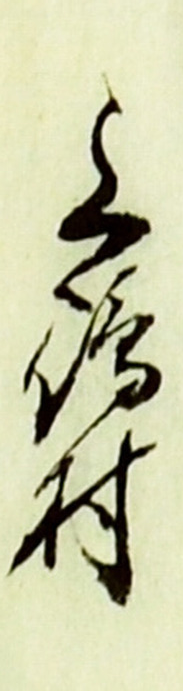上嶋村
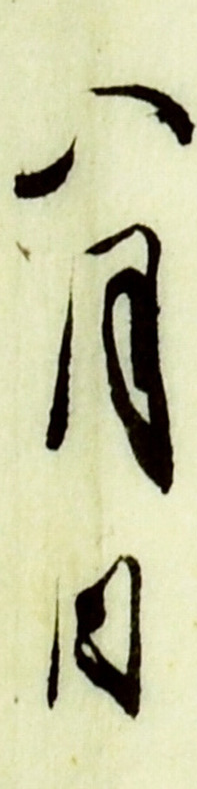八月日
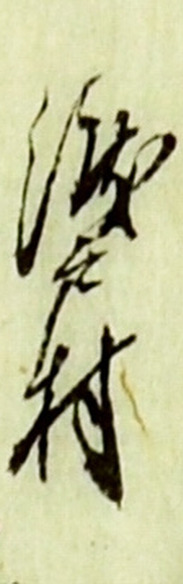渡戸村
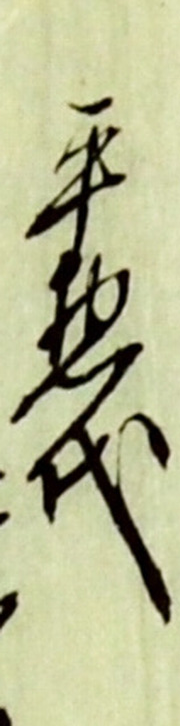平惣代
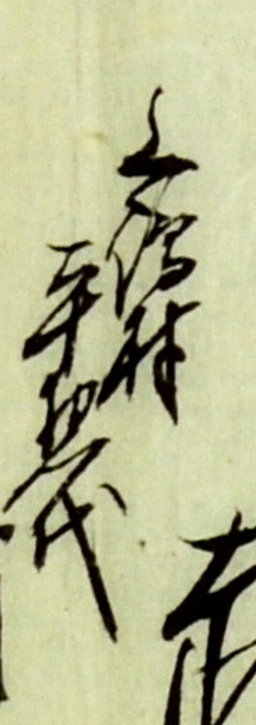平惣代
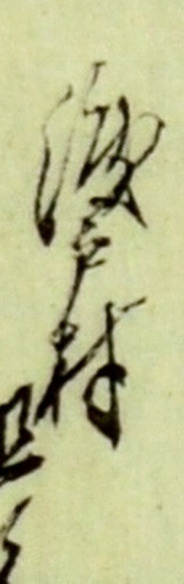渡戸村

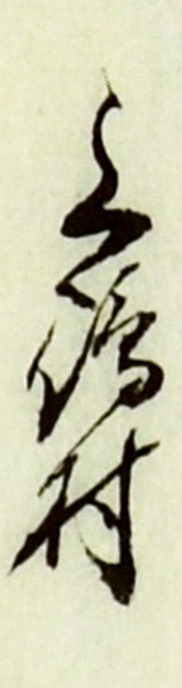上嶋村
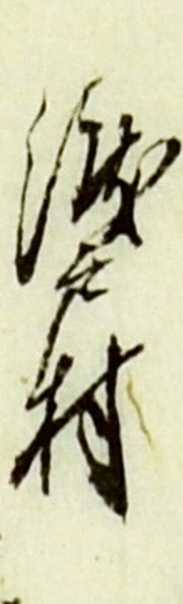渡戸村
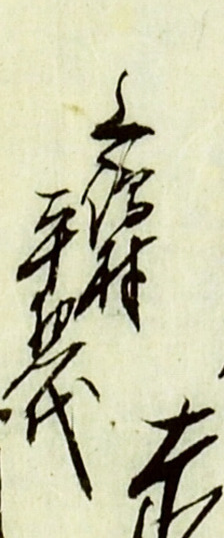上嶋村
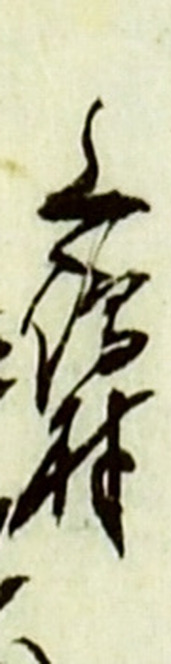上嶋村
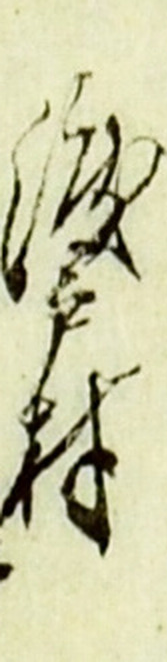渡戸村
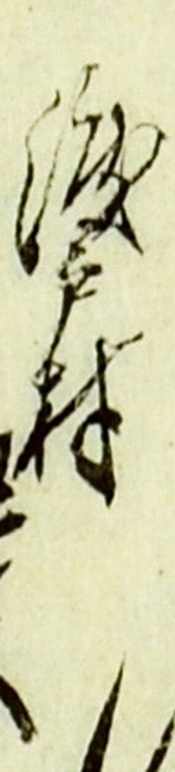渡戸村
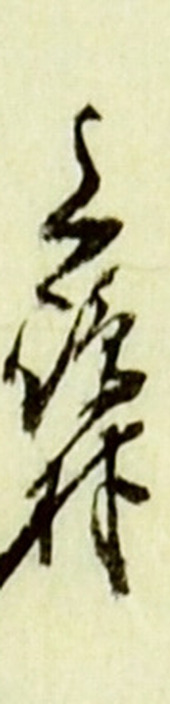上嶋村
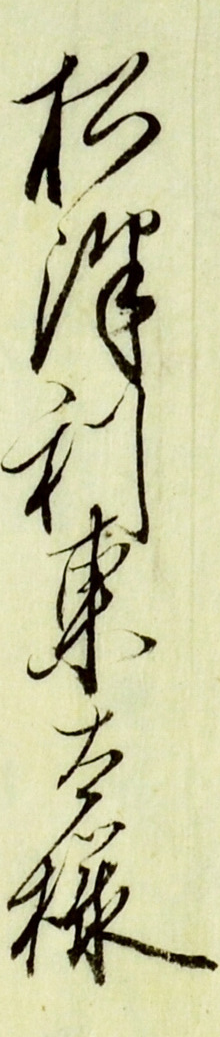松澤利東太様

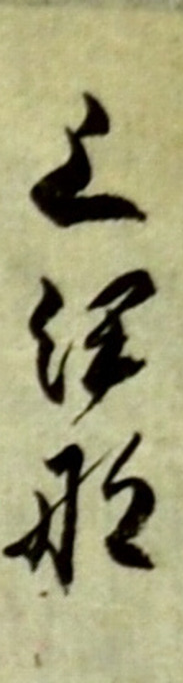上伊那
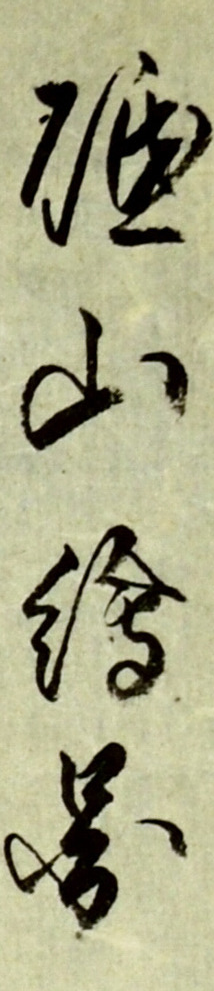砥山絵図
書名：乍恐以書付奉願上候御事
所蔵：伊那市立高遠町図書館・合同会社AMANE
